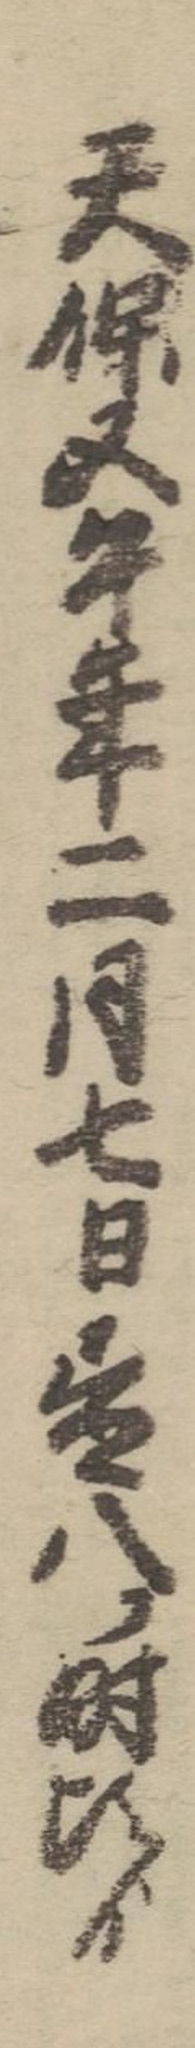天保五午年二月七日昼八ッ時頃ゟ
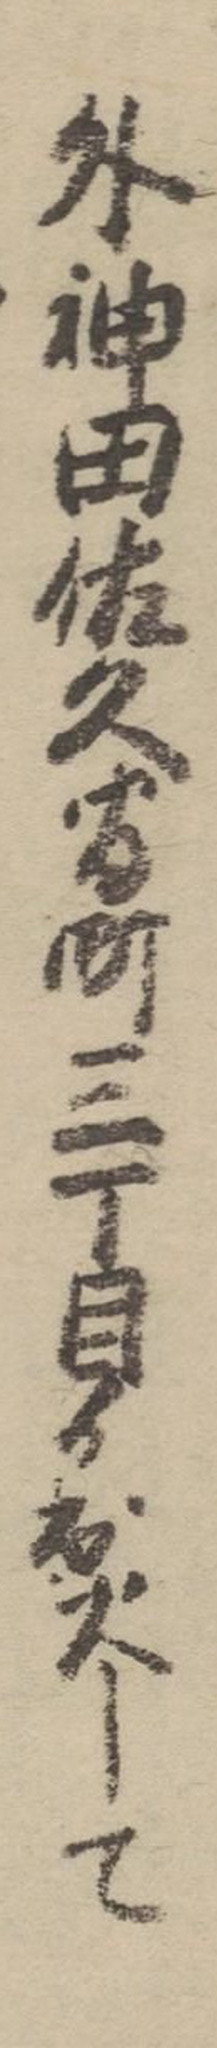外神田佐久間町三丁目ゟ出火して
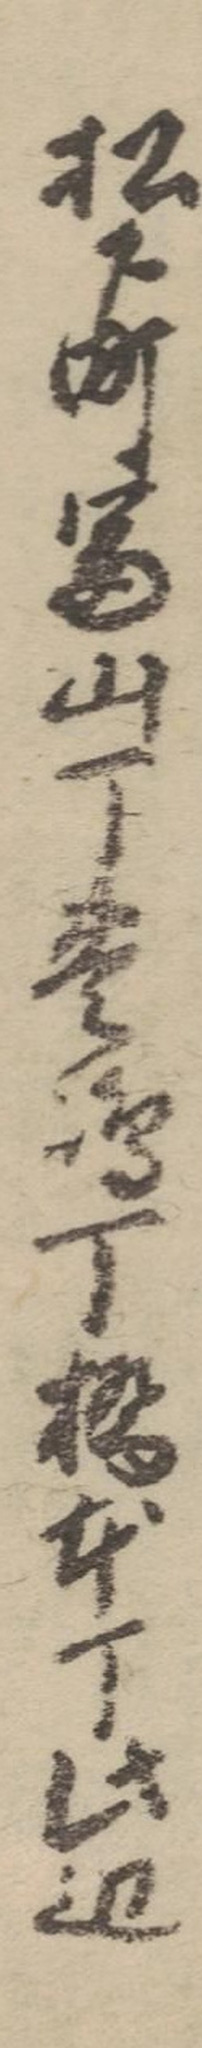松下町富山丁堂島丁橋本丁此辺
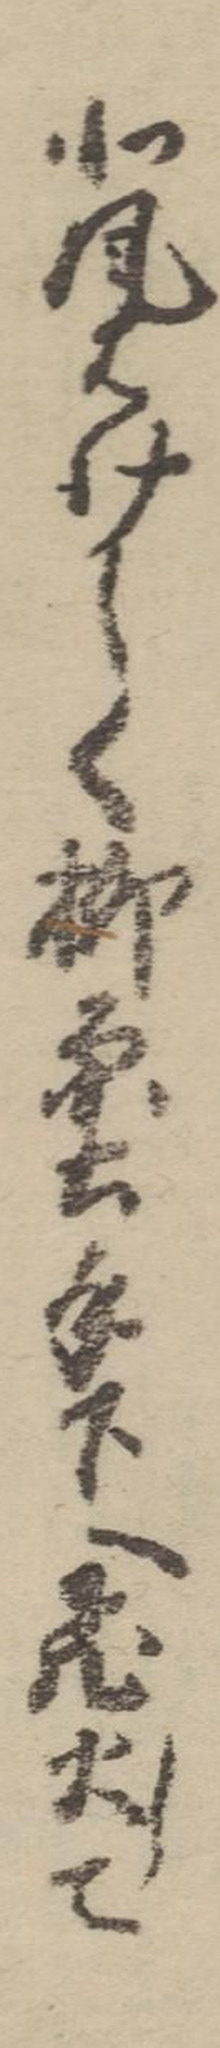北風はけしく柳原土手下へ飛火して
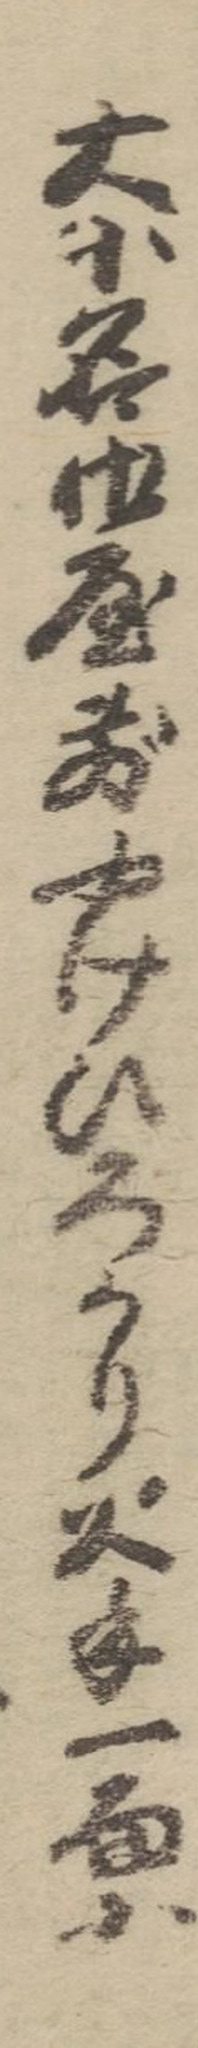大小名御屋敷やけひろがり火手一面に
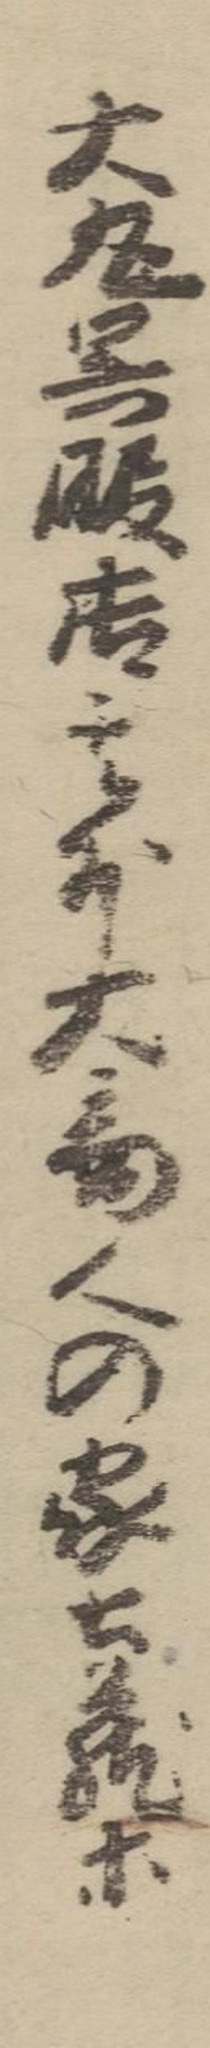大丸呉服店其外大商人の家土蔵等
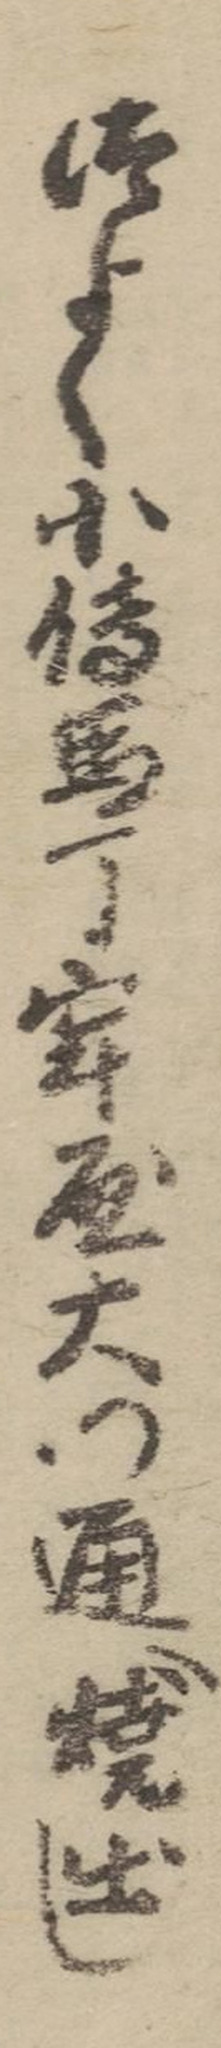つよく小伝馬町丁牢屋大門通へ焼出し
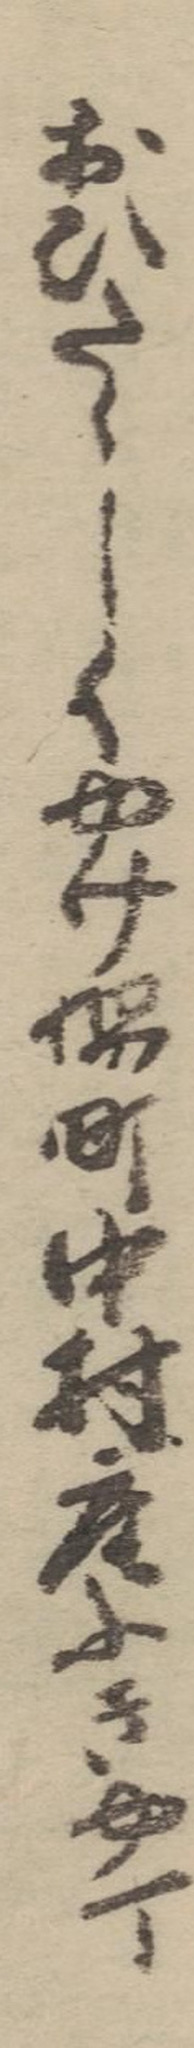おひたゞしくやけ堺町中村座ふきや丁
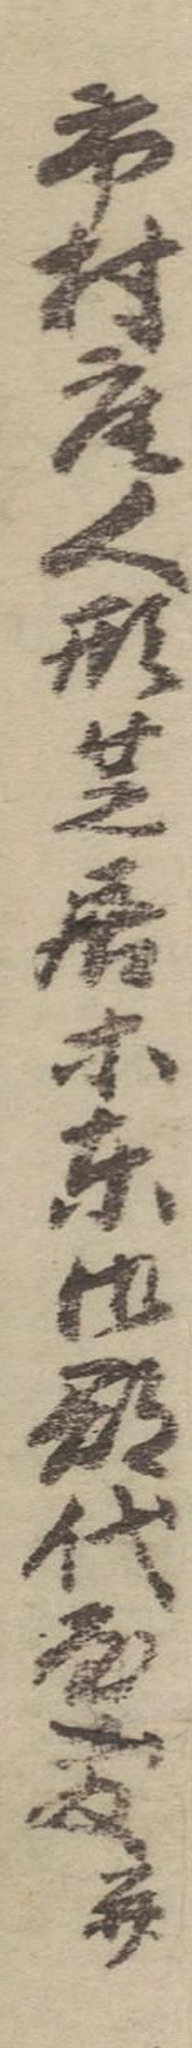市村座人形芝居等東御郡代通前并
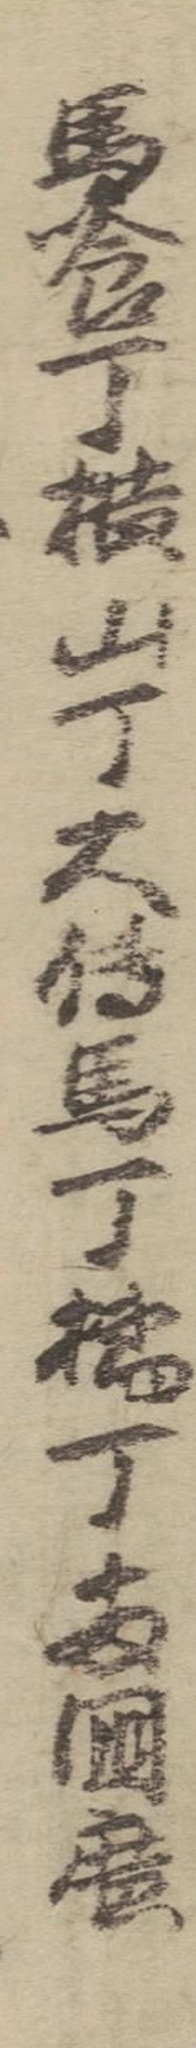馬喰丁横山丁大伝馬丁橘町両国広
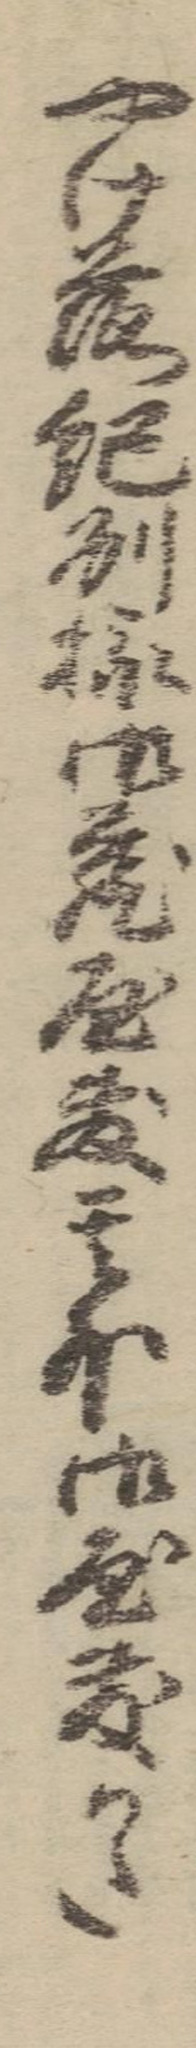焼落紀州様御蔵屋敷其外御屋敷かた
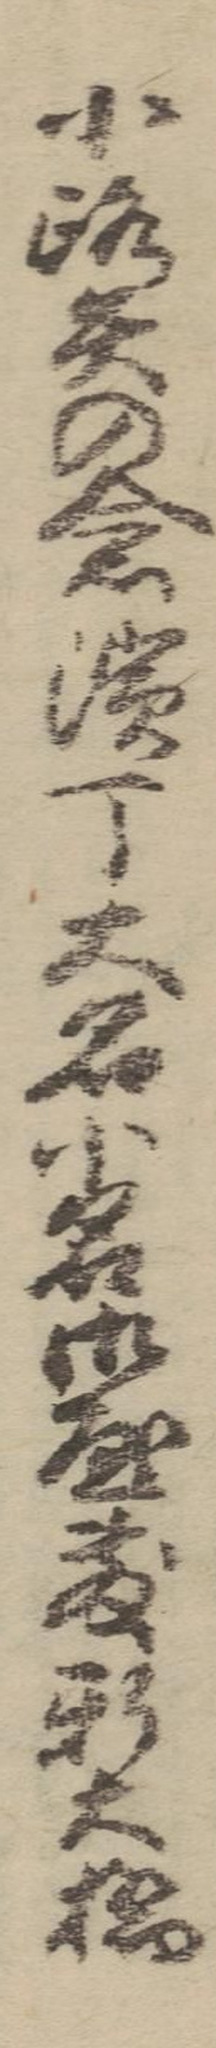小路矢の倉浜丁大名小名御屋敷新大橋
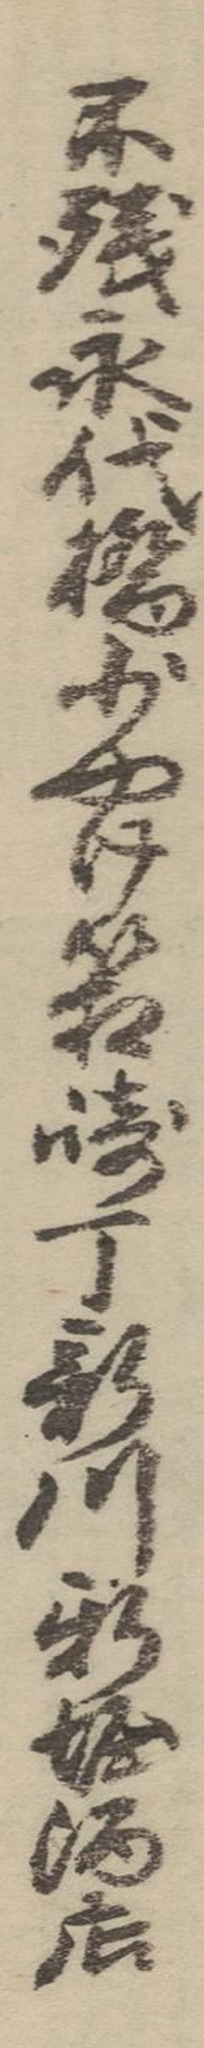不残永代橋少やけ箱崎丁新川新堀酒店
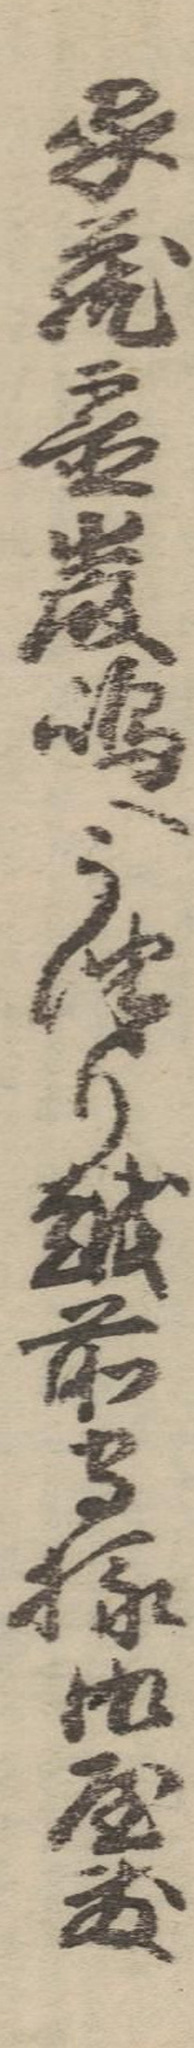家蔵霊巖嶋へうつり越前守様御屋敷
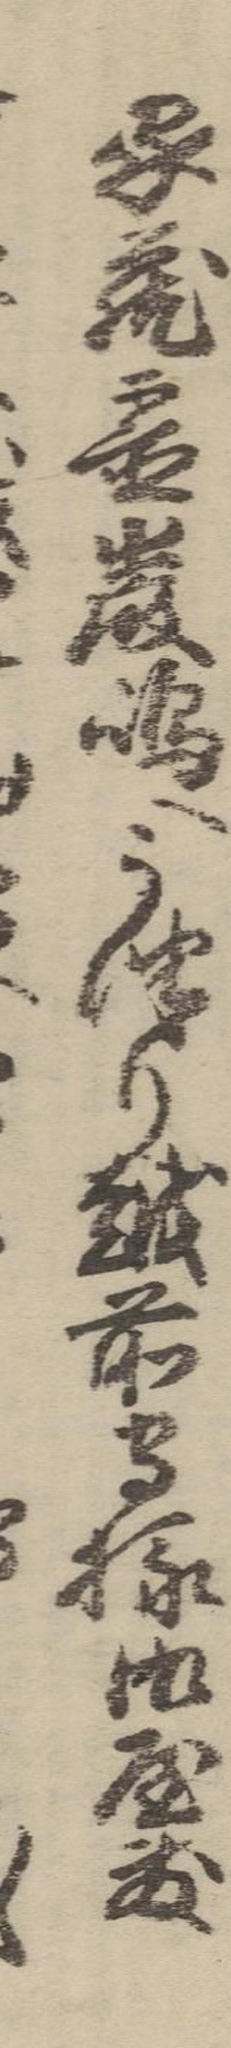家蔵霊巖嶋へうつり越前守様御屋敷
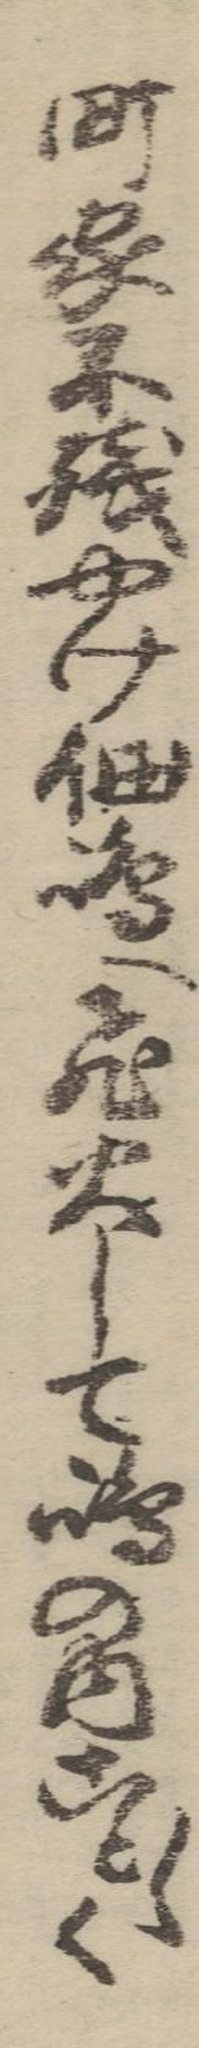町家不残やけ佃嶋へ飛火して嶋の内こと〴〵く
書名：[天保五年二月の江戸大火に関する瓦版]
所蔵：東京大学地震研究所図書室 Earthquake Research Institute Library, The University of Tokyo, JAPAN
